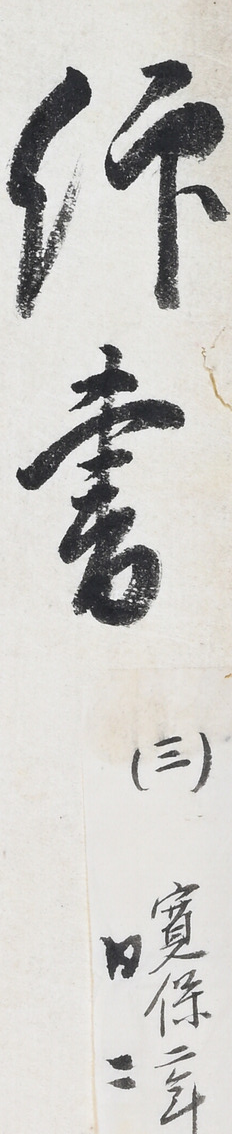仰書(三)寛保二年
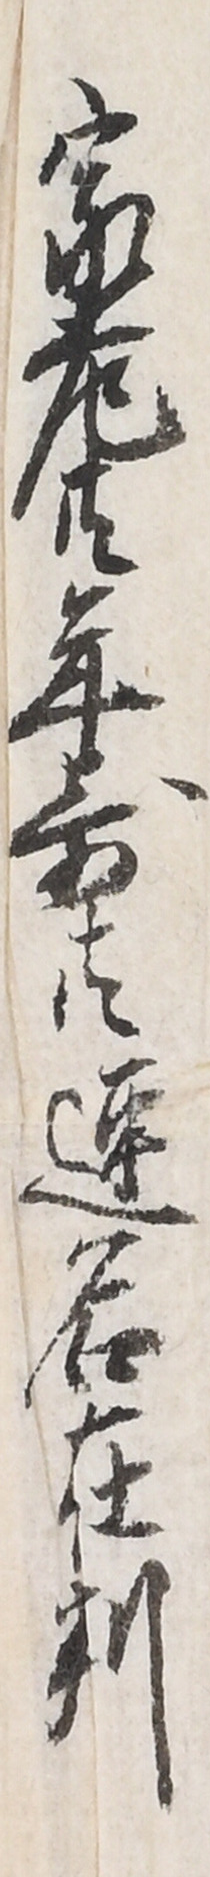家老共年寄共連名在判

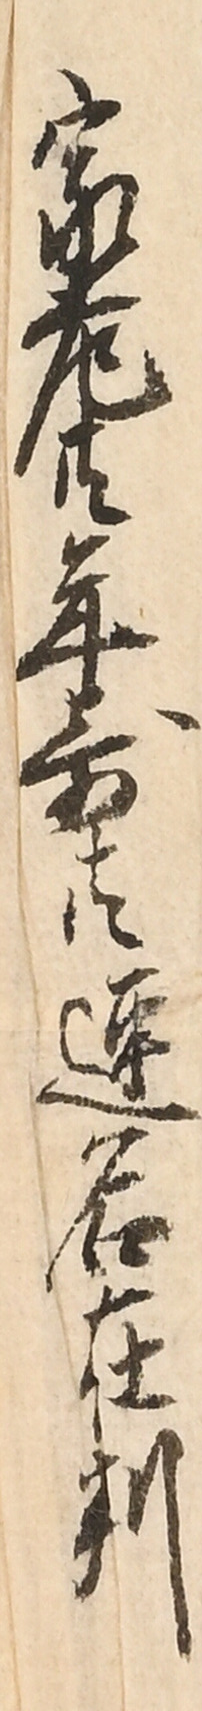家老共年寄共連名在判

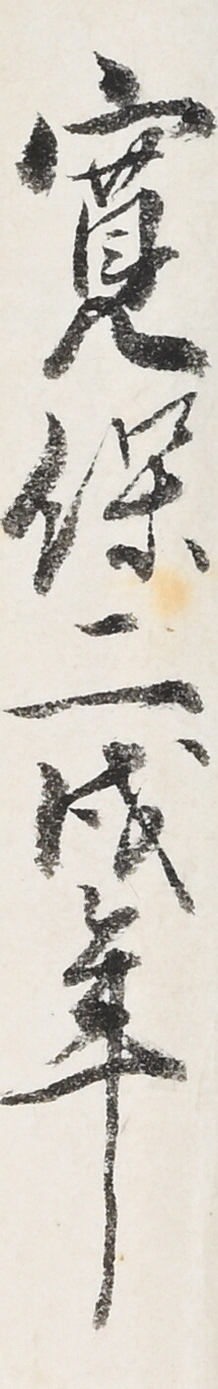寛保二戌年
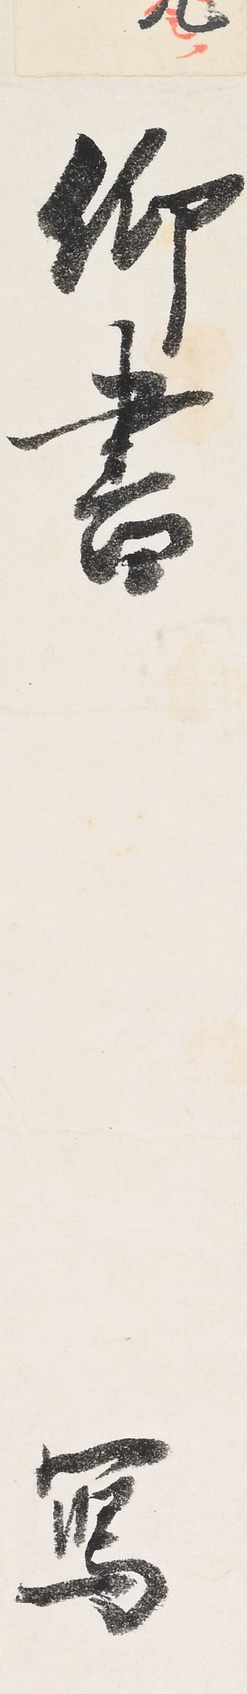仰書写

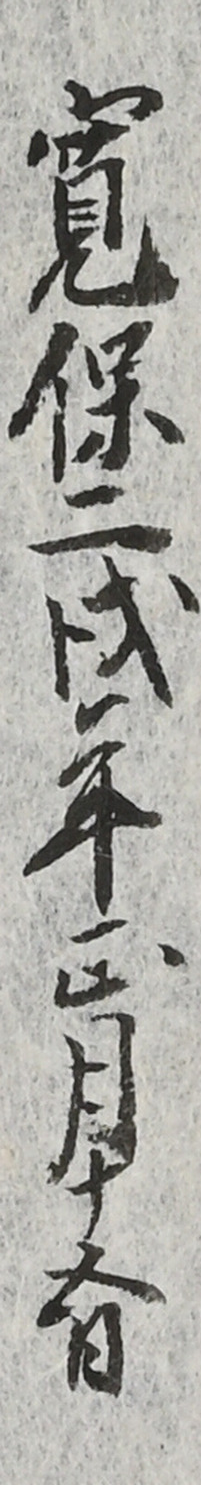寛保二戌年正月十五日
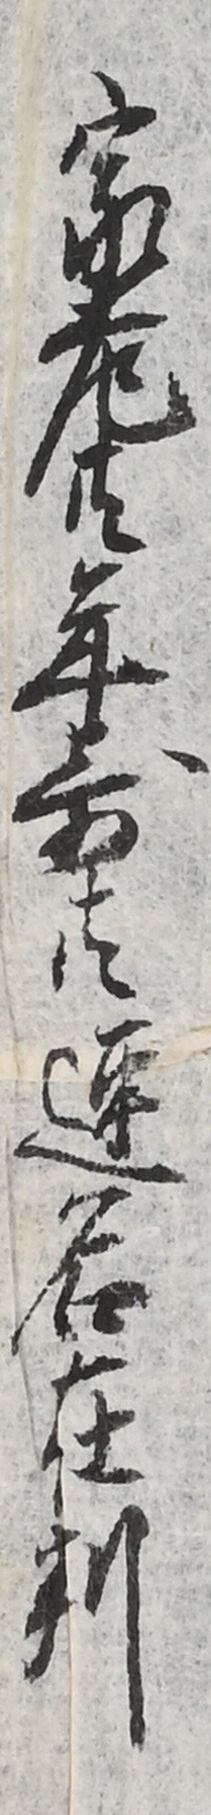家老共年寄共連名在判

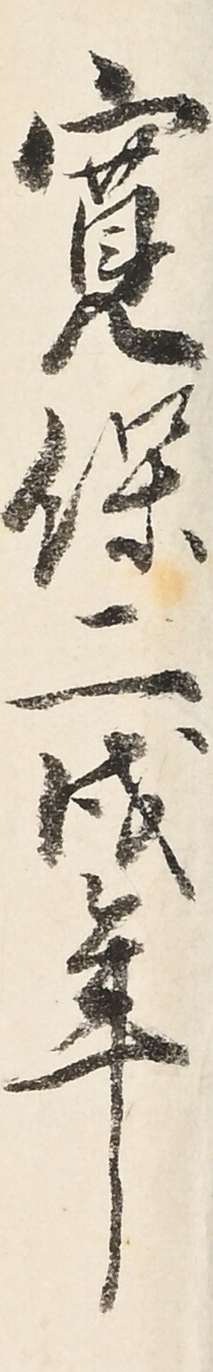寛保二戌年
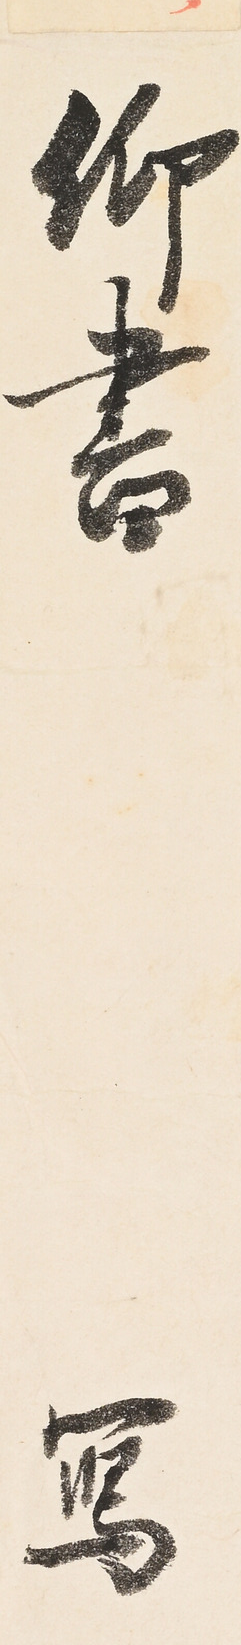仰書写

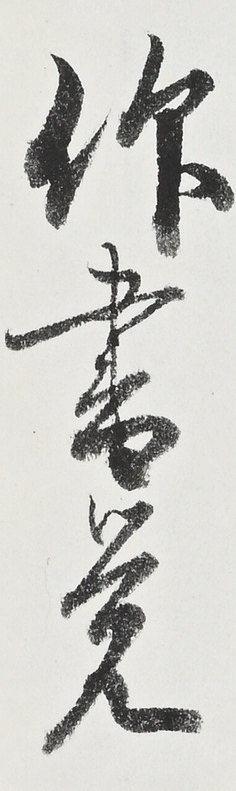仰書覚
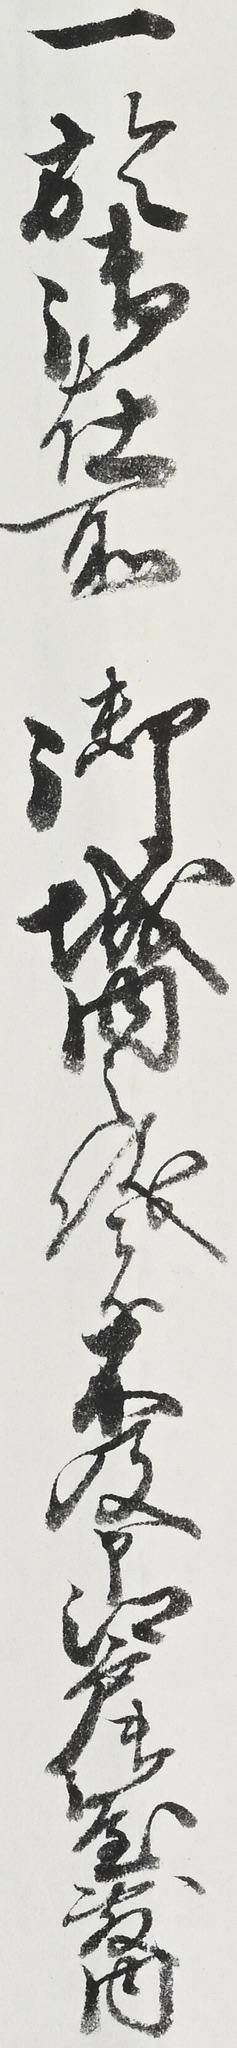一於御在所御城内之儀者不及申江戸御屋敷内
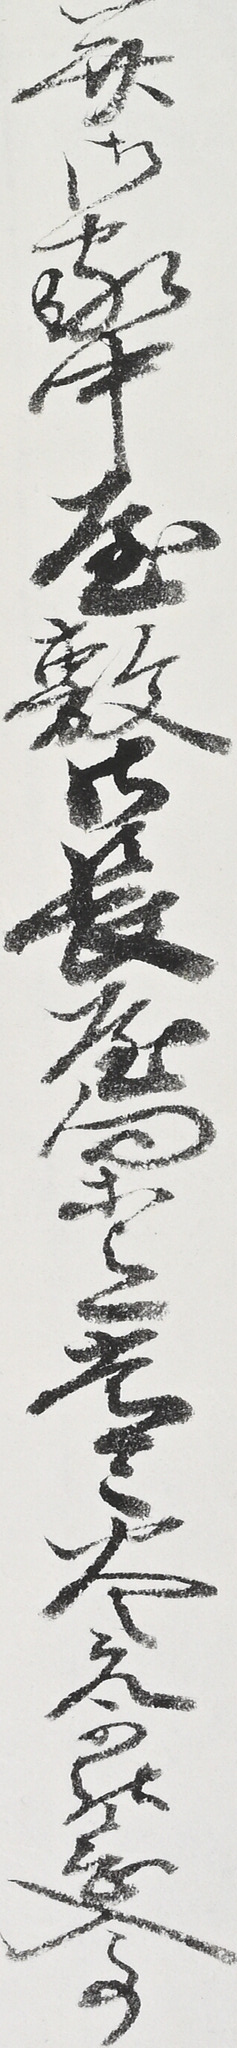幷御家中屋敷御長屋向等迄常々火之元可被念入事
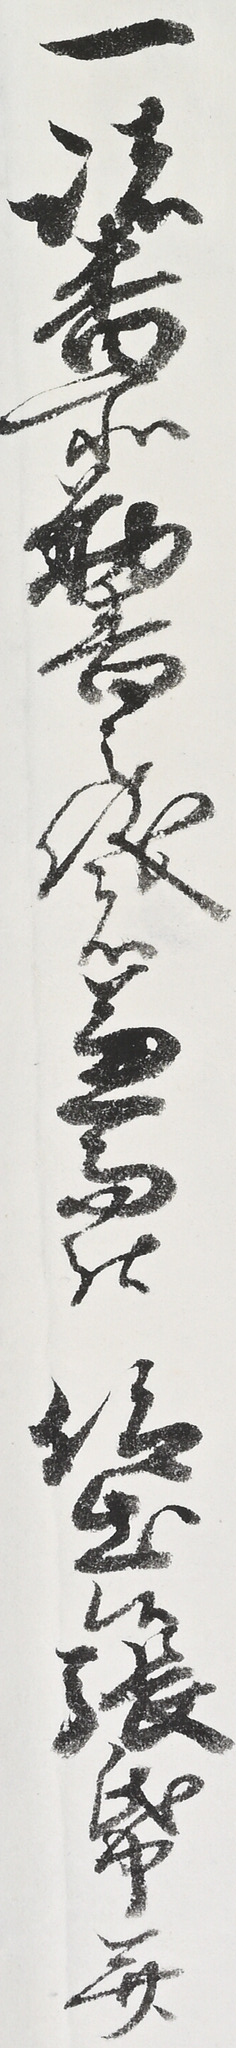一諸番所勤番之儀者兼而被仰出候張紙幷
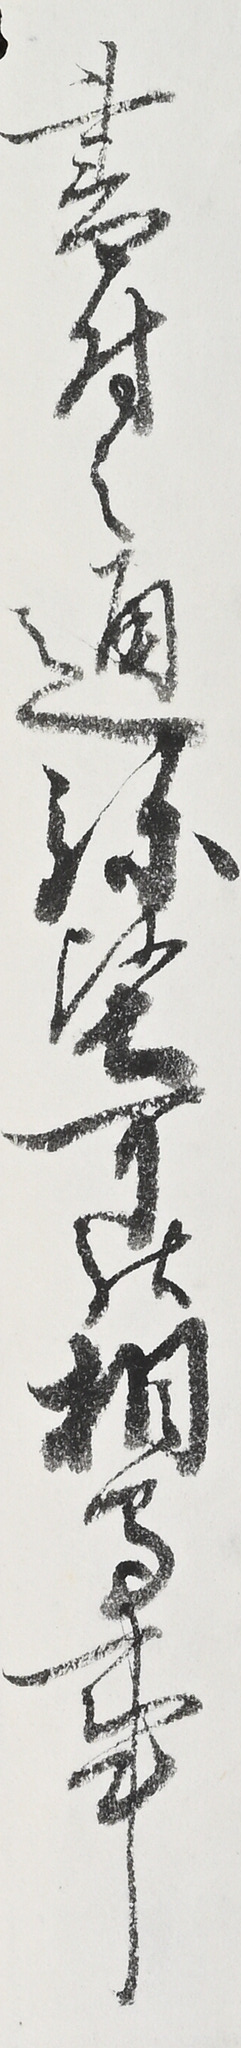書付之通弥堅可被相守事
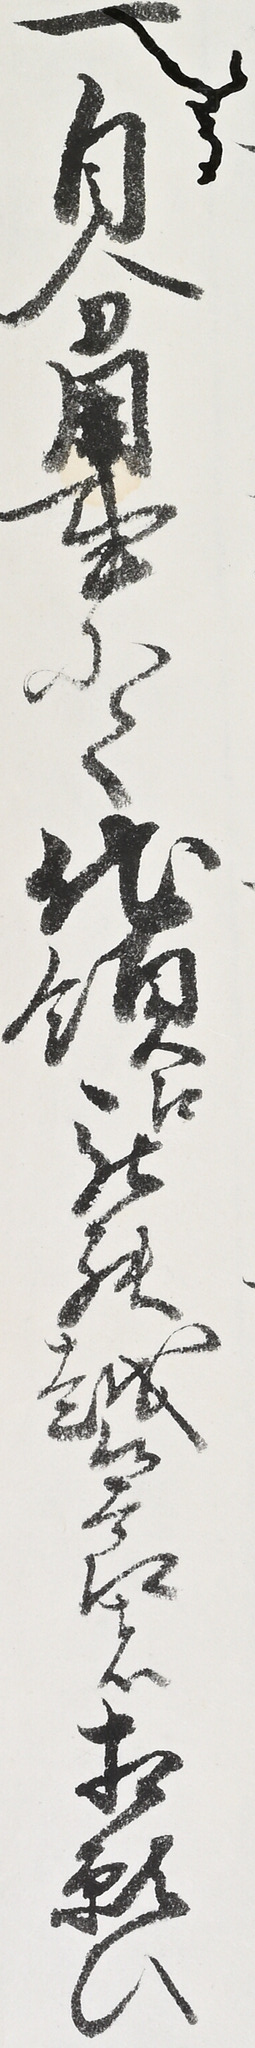一自分用事にて他領江被罷越候節者相願ひ
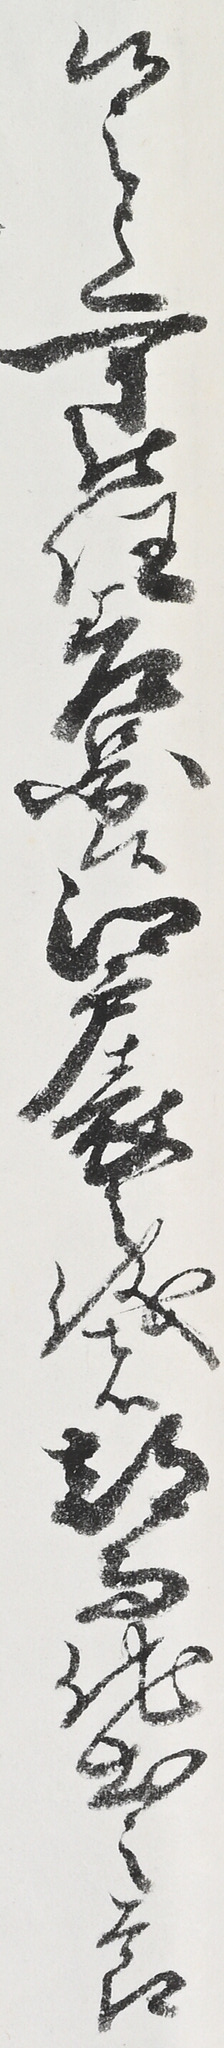候之上可被任差図候江戸表之儀者都而他出之節
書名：仰書覚〔写共二通一括〕
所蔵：伊那市立高遠町図書館・合同会社AMANE
